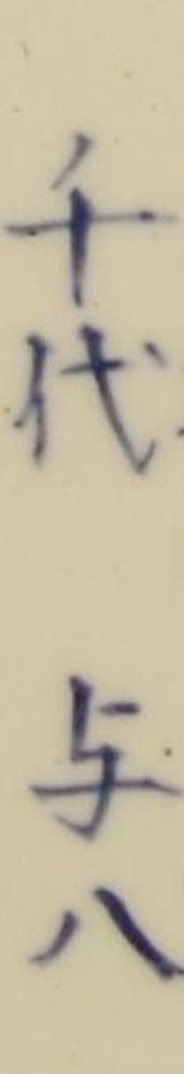千代与八
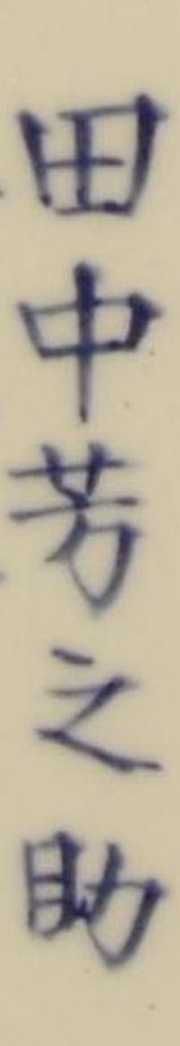田中芳之助
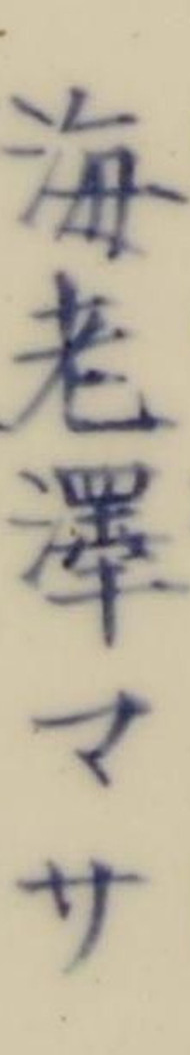海老澤マサ
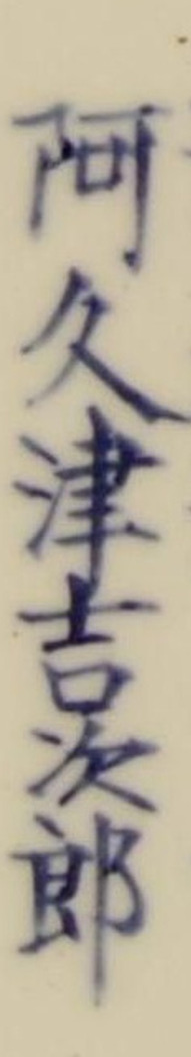阿久津吉次郎
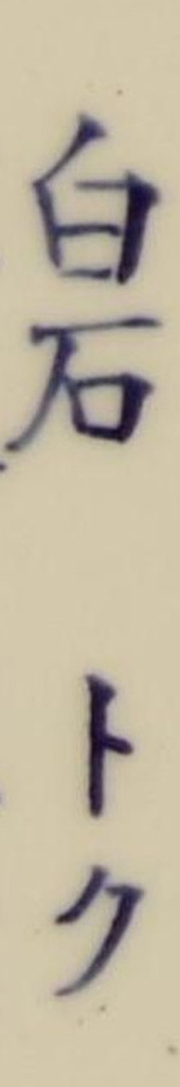白石トク
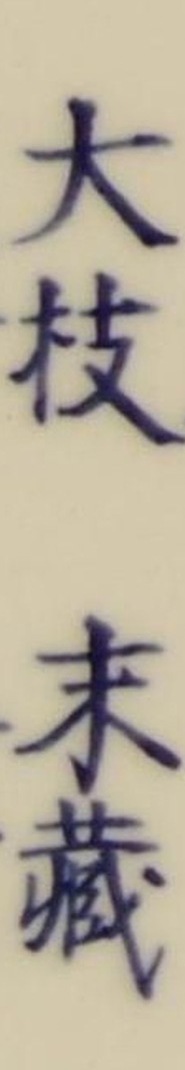大枝末蔵
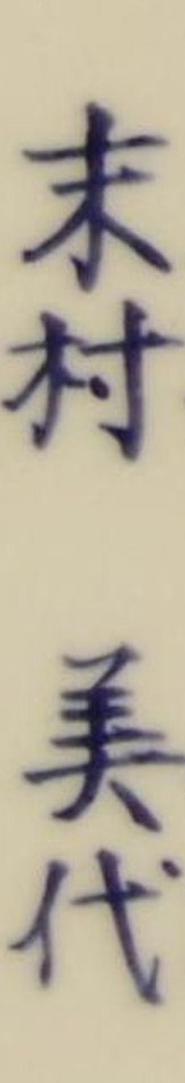末村美代
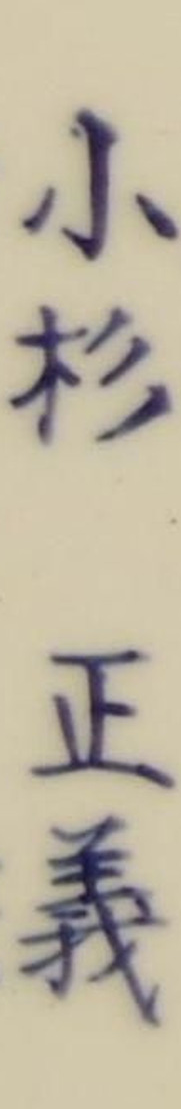小杉正義
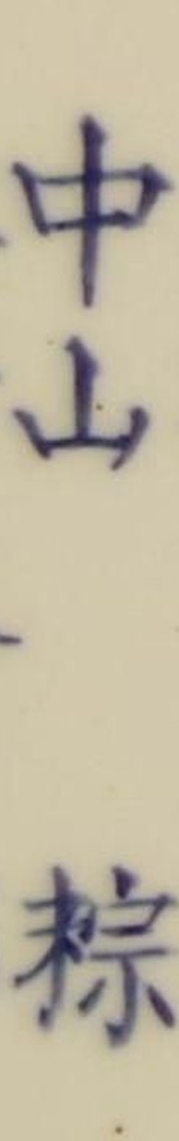中山粽
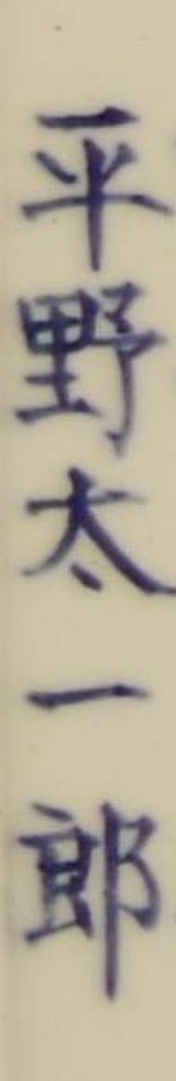平野太一郎

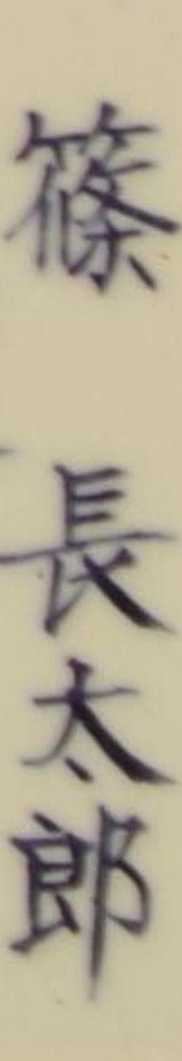篠長太郎
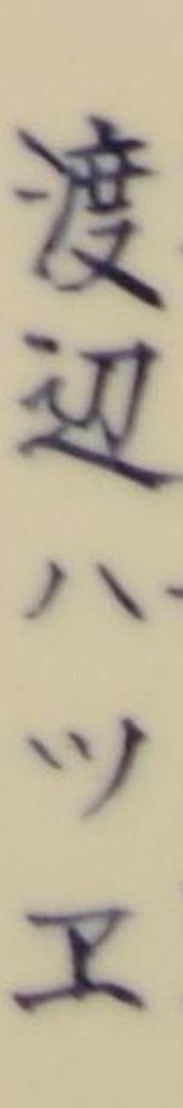渡辺ハツエ
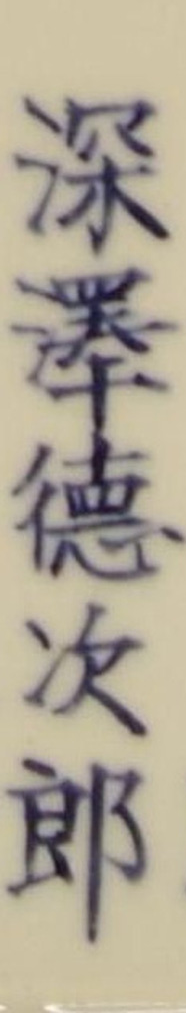深澤徳次郎
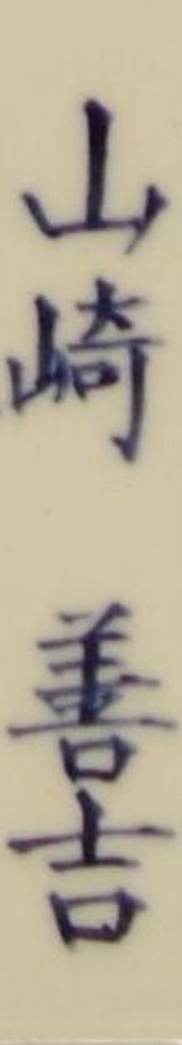山崎善吉
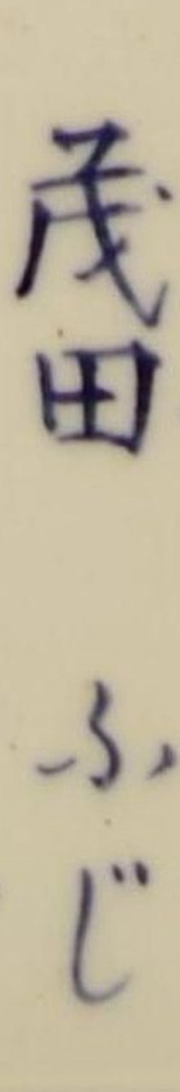茂田ふじ
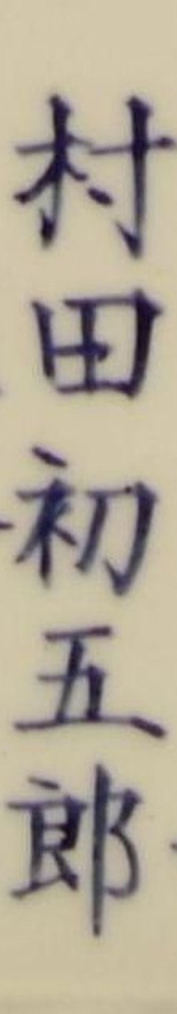村田初五郎
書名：E~L
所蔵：高野山金剛峯寺
